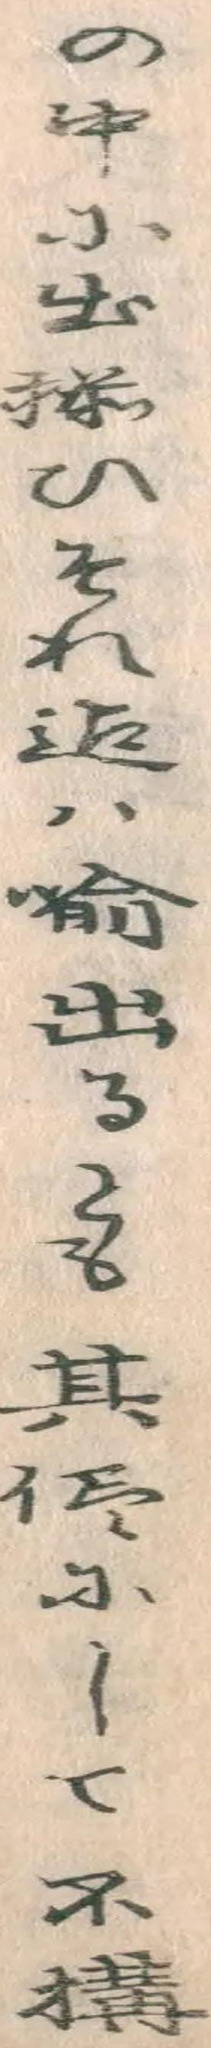の中に出揃ひそれ迄は喩出るとも其侭にして不搆
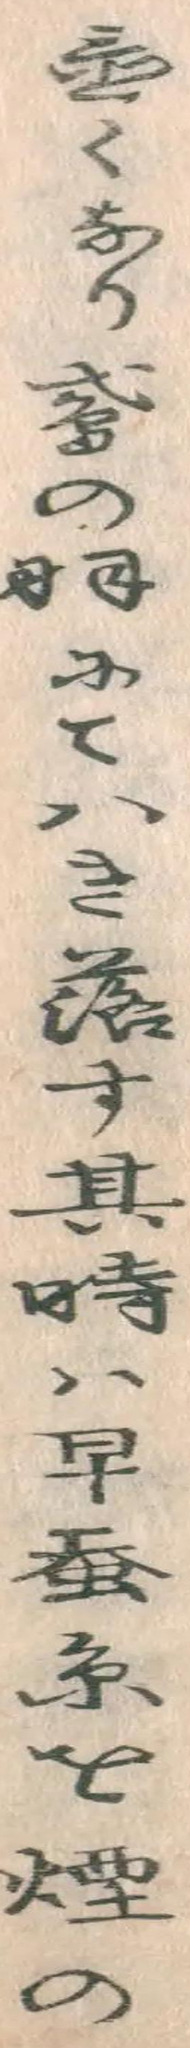置くなり鳶の羽にてはき落す其時は早蚕糸を煙の
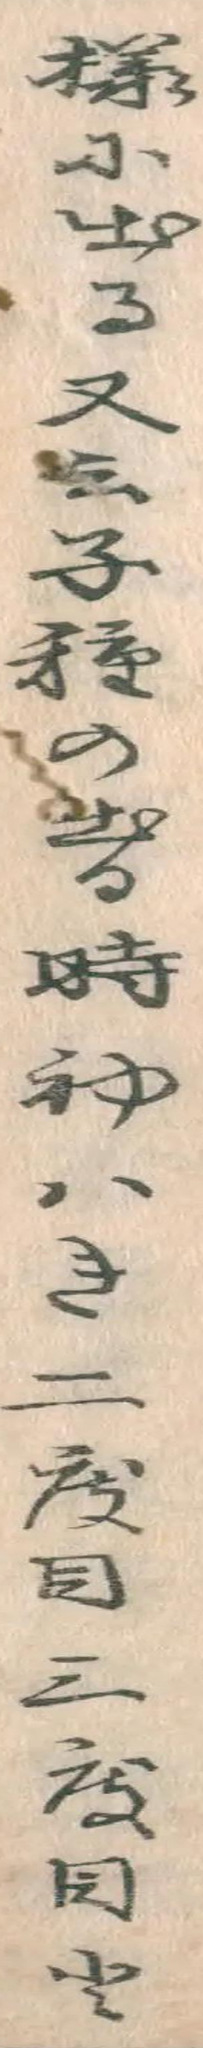様に出る又云子種の出る時初はき二度目三度目と
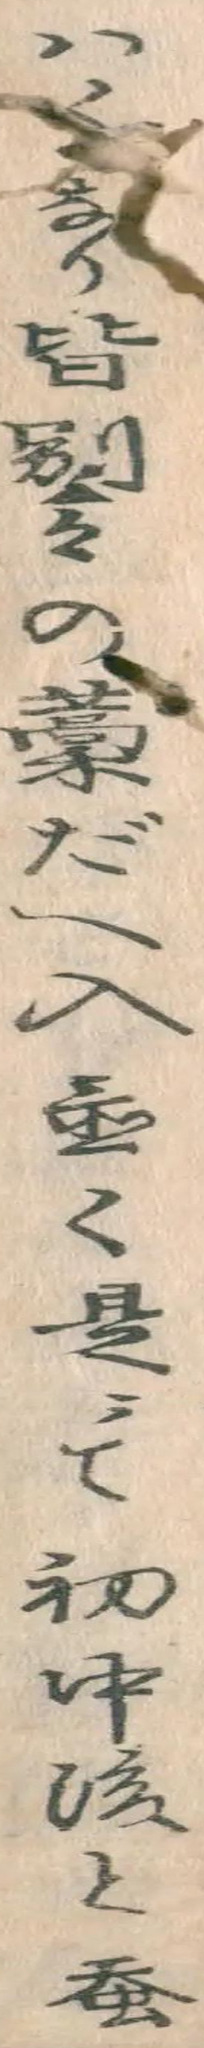はくなり皆別々の藁だへ入置く是にて初中後と蚕

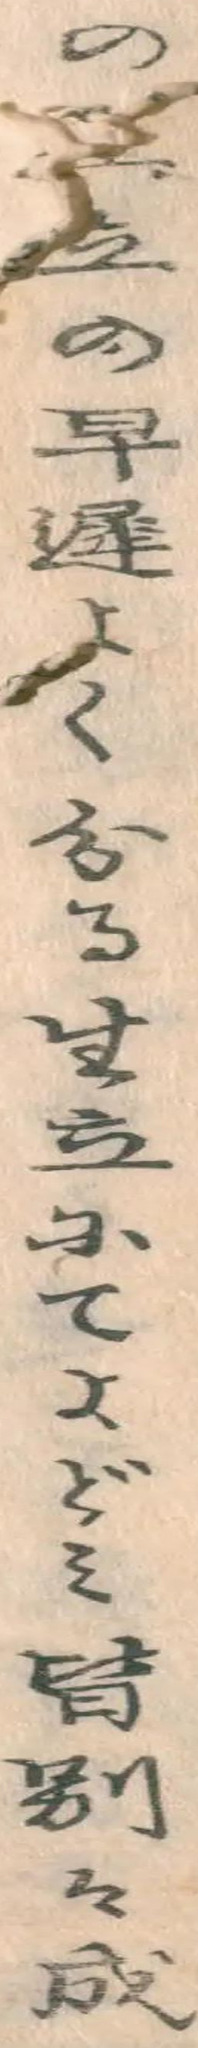の生立の早遅よく分る生立にてよどみ皆別々成
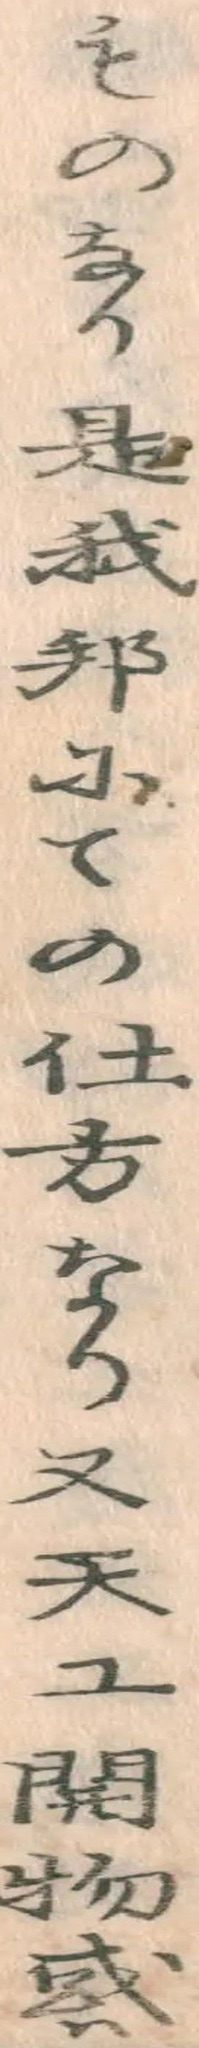ものなり是我邦にての仕方なり又天工開物或は
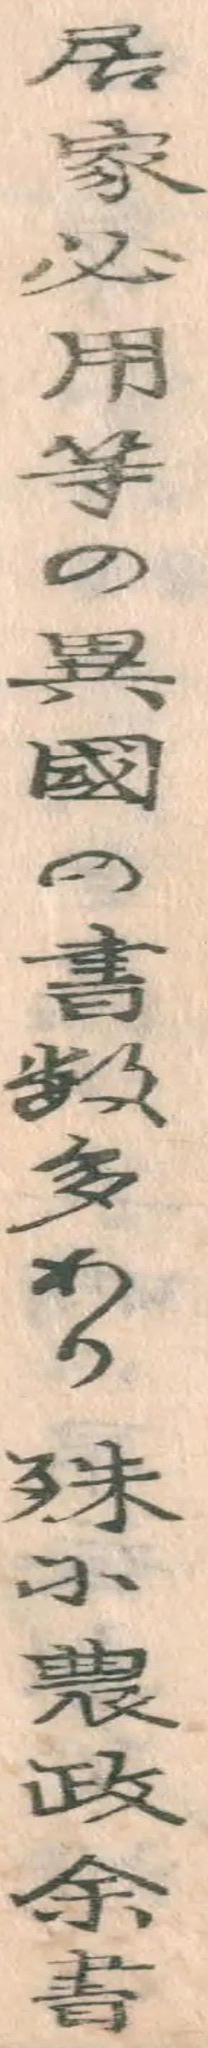居家必用等の異国の書数多あり殊に農政余書
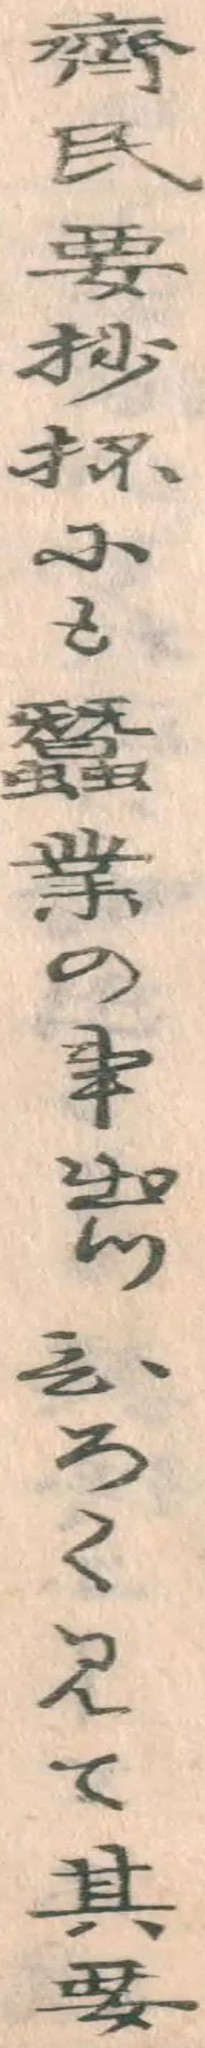斉民要抄抔にも蚕業の事出つひろく見て其要
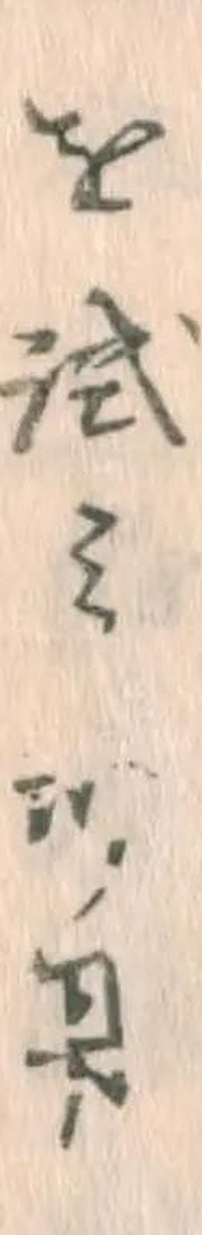を試み可用
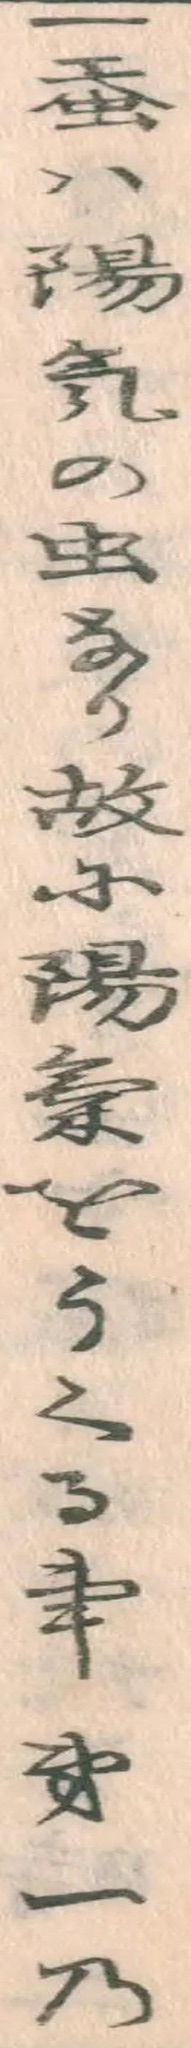一蚕は陽気の虫なり故に陽気をうくる事第一の
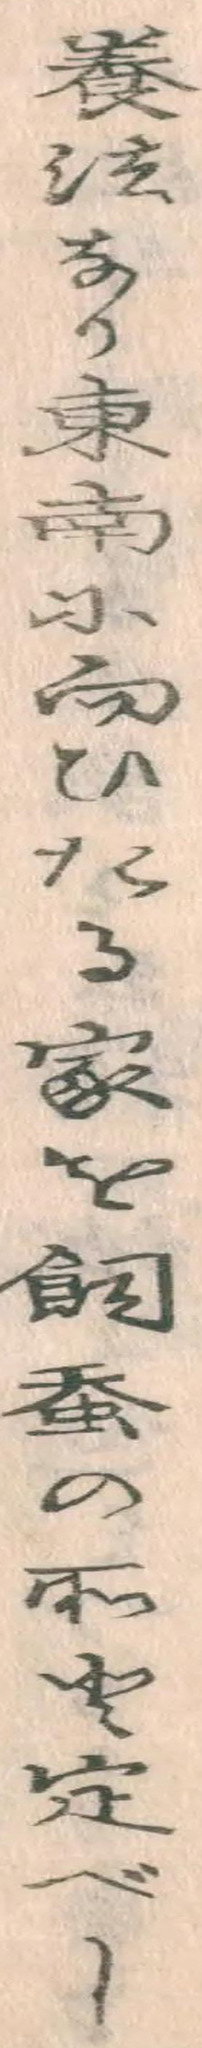養法なり東南に向ひたる家を飼蚕の所と定べし
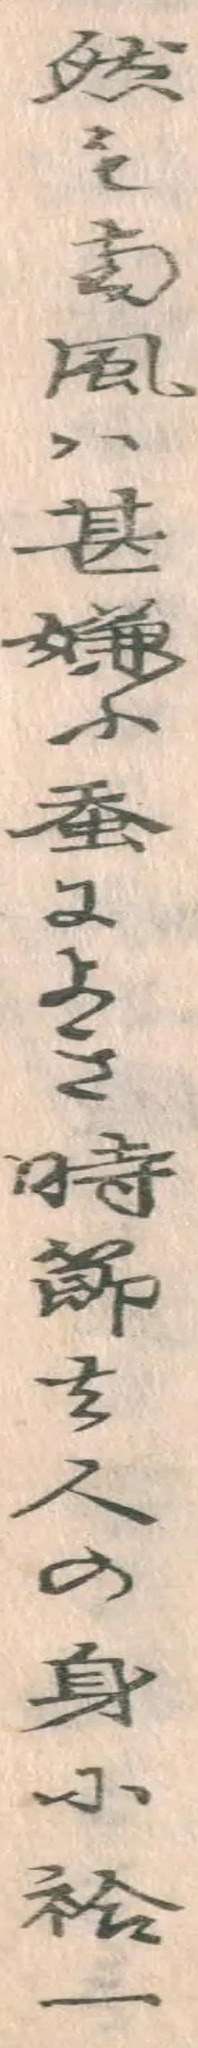然も南風は甚だ嫌ふ蚕によき時節は人の身に袷一
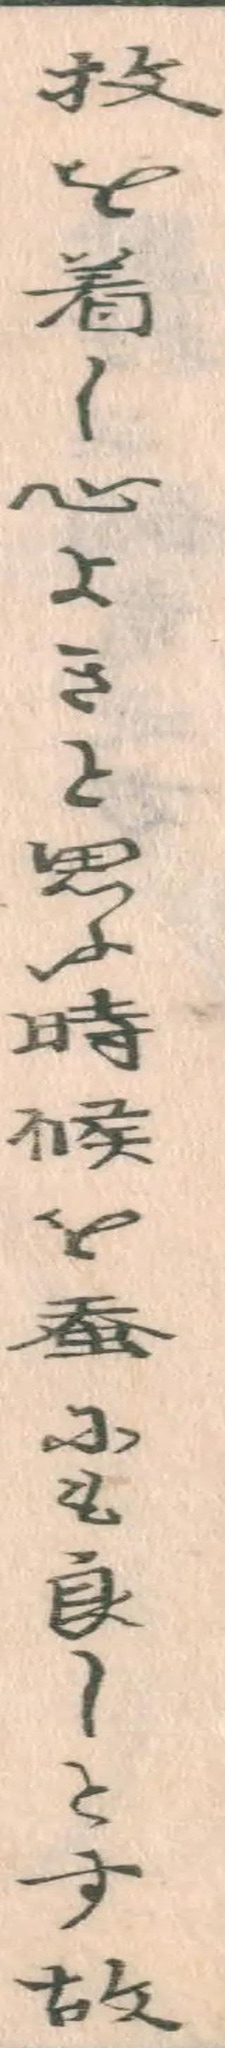枚を着し心よきと思ふ時候を蚕にも良しとす故
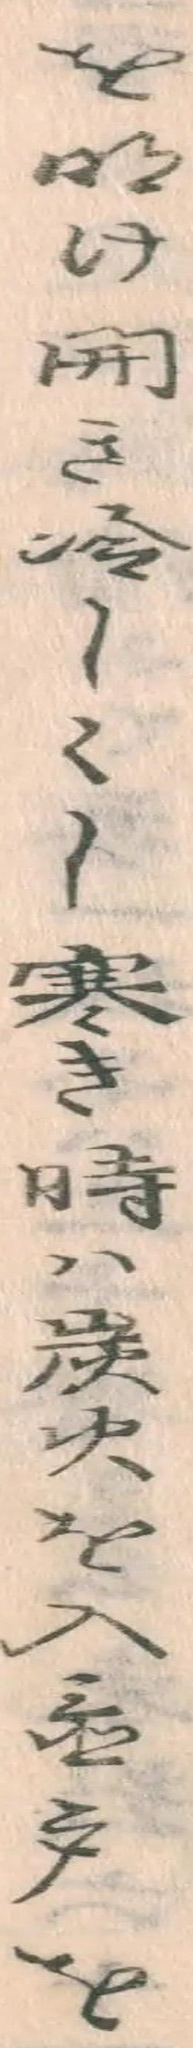を明け開き冷しくし寒き時は炭火を入置戸を
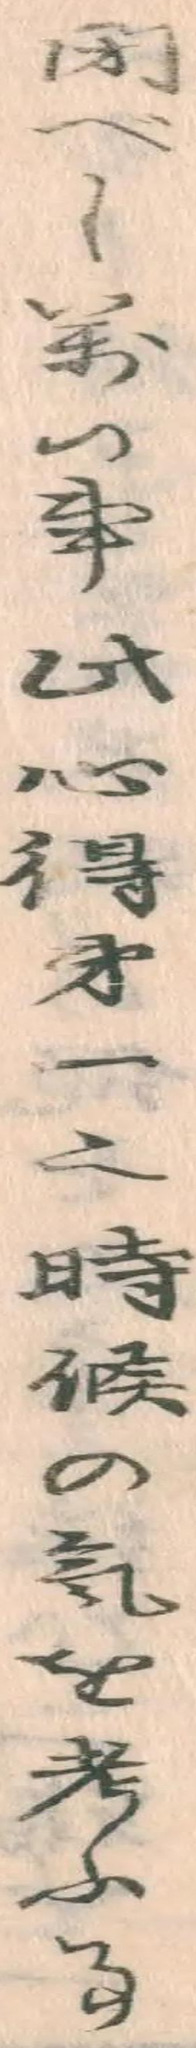閉べし万の事此心得第一也時候の気を考ふ事
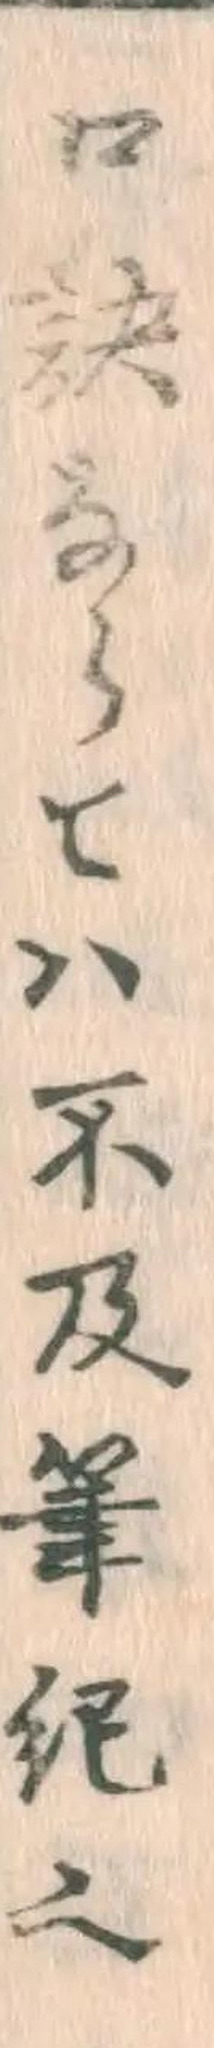口訣ならては不及筆紀也
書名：機織彙編 5巻. [1]
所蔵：国立国会図書館 National Diet Library, JAPAN
